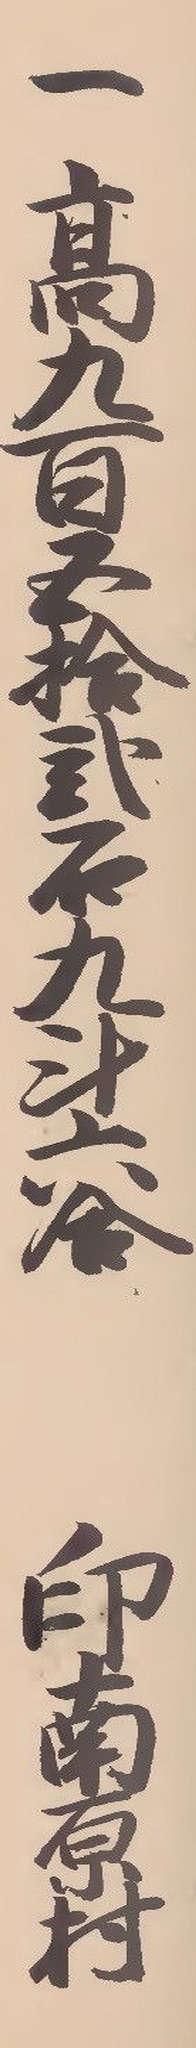一高九百五拾弐石九斗六合印南原村
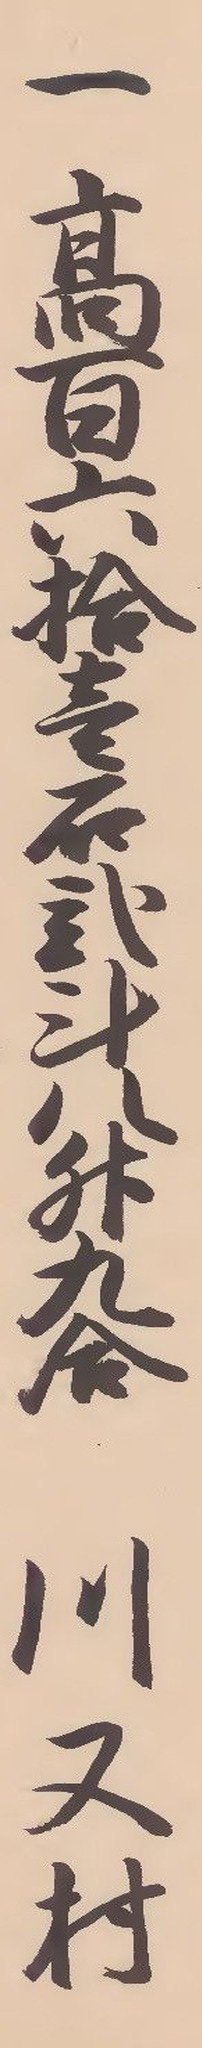一高百六拾壱石弐斗八升九合川又村
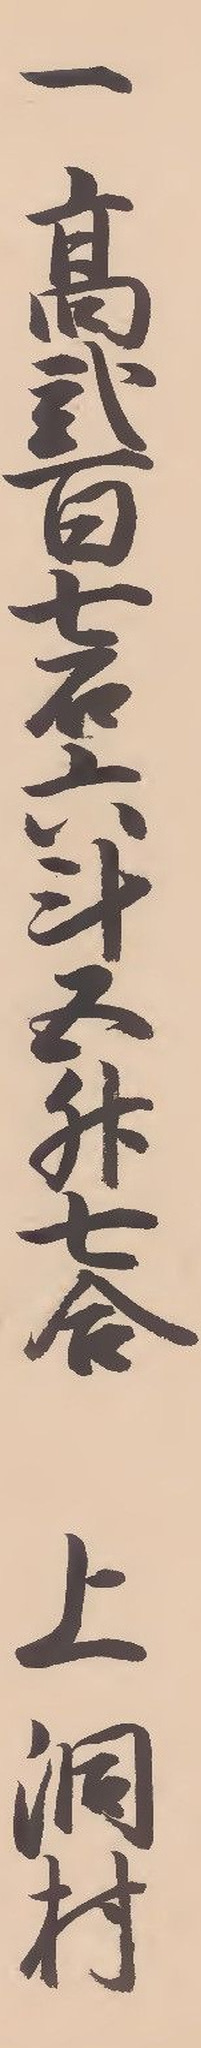一高弐百七石六斗五升七合上洞村
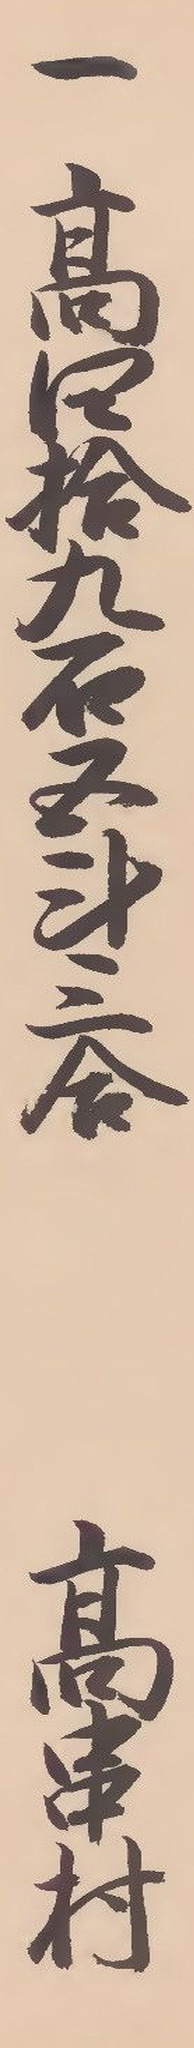一高四拾九石五斗三合高串村

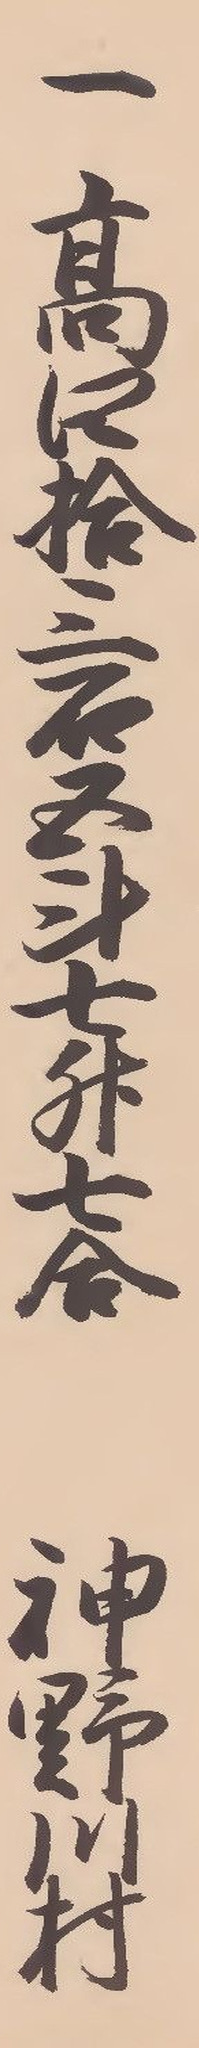一高四拾三石五斗七升七合神野川村
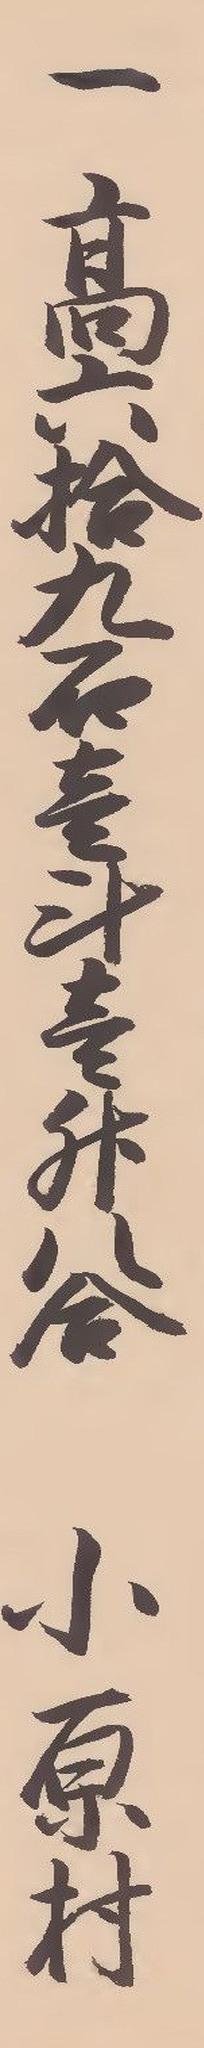一高六拾九石壱斗壱升八合小原村
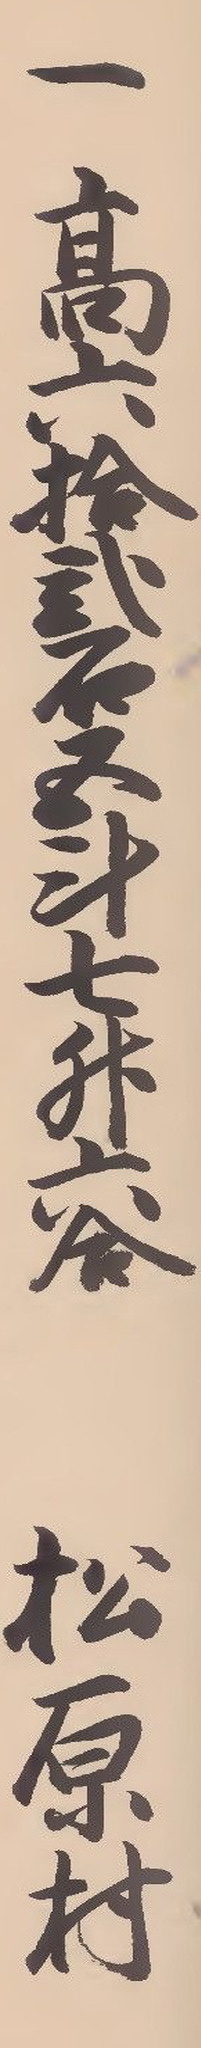一高六拾弐石五斗七升六合松原村
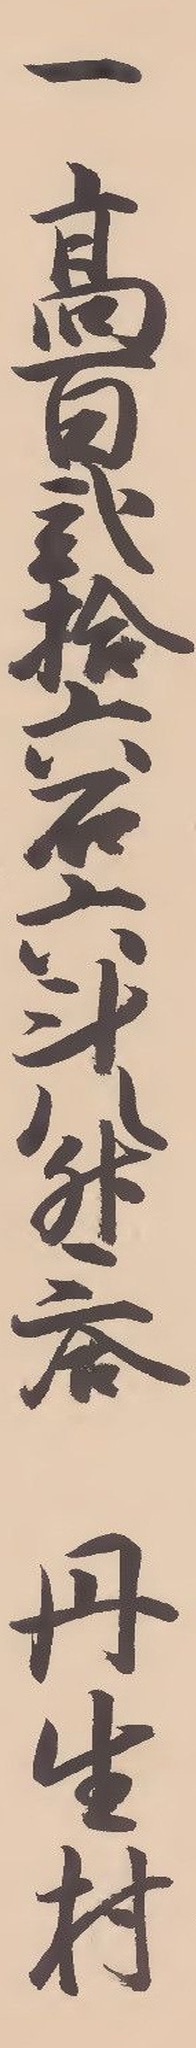一高百弐拾六石六斗八升三合丹生村
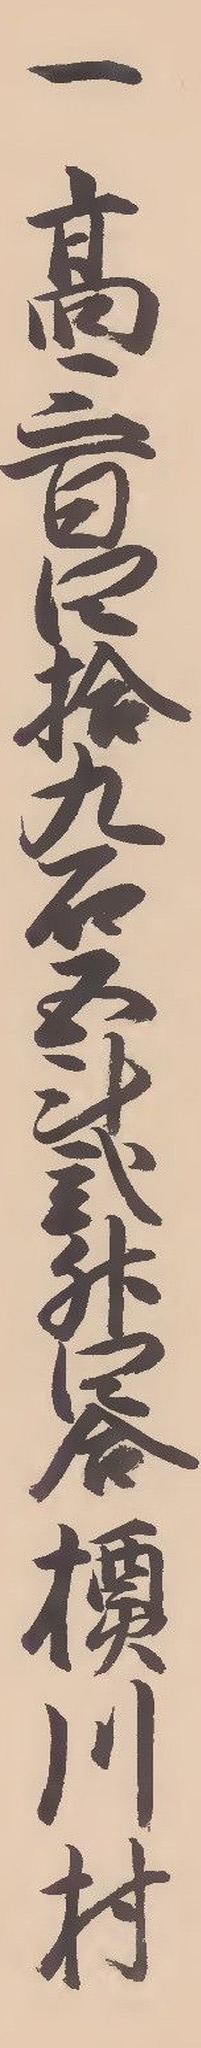一高三百四拾九石五斗弐升四合樮川村

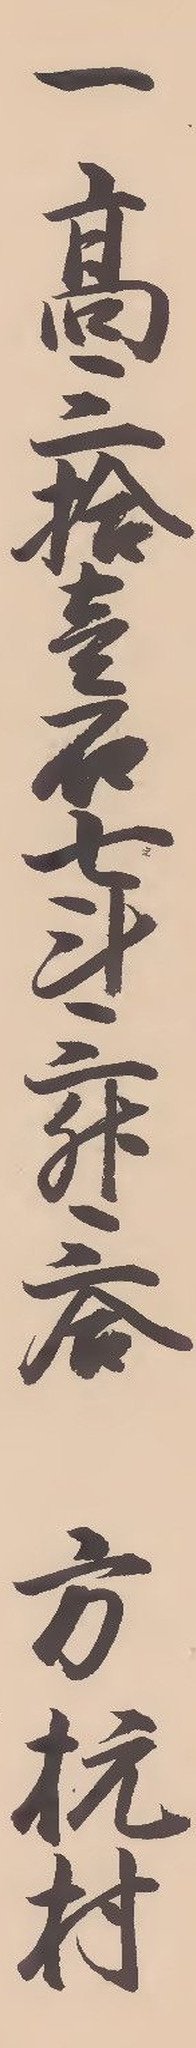一高三拾壱石七斗三升三合方杭村
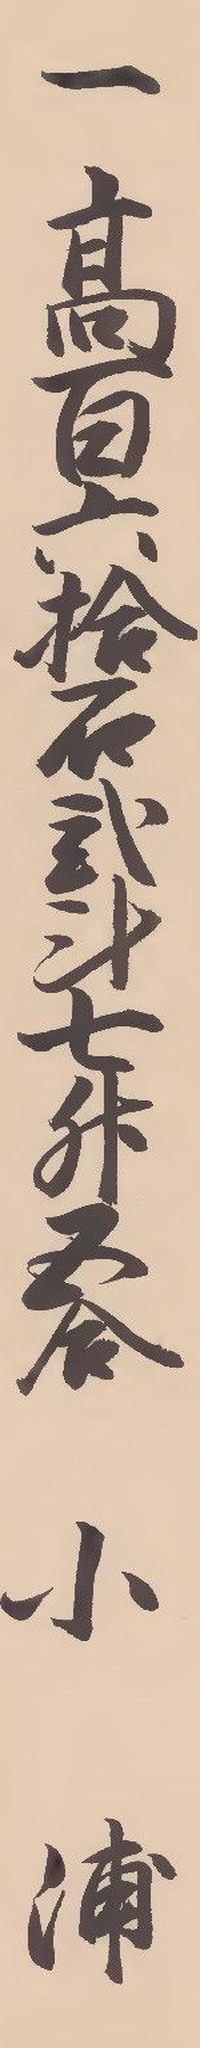一高百六拾石弐斗七升五合小浦
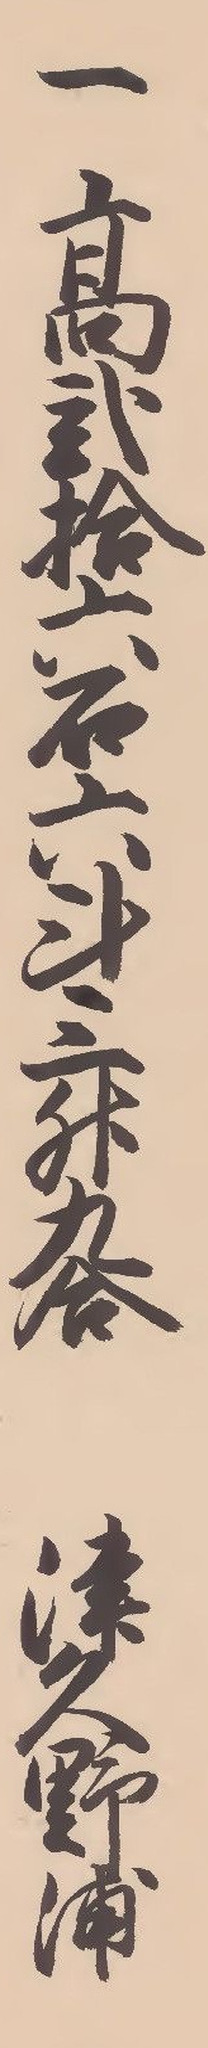一高弐拾六石六斗三升九合津久野浦
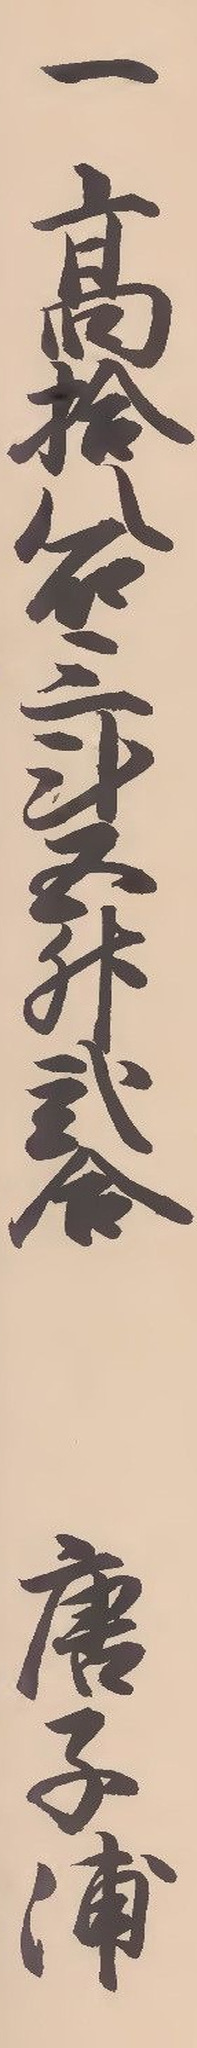一高拾八石三斗五升弐合唐子浦
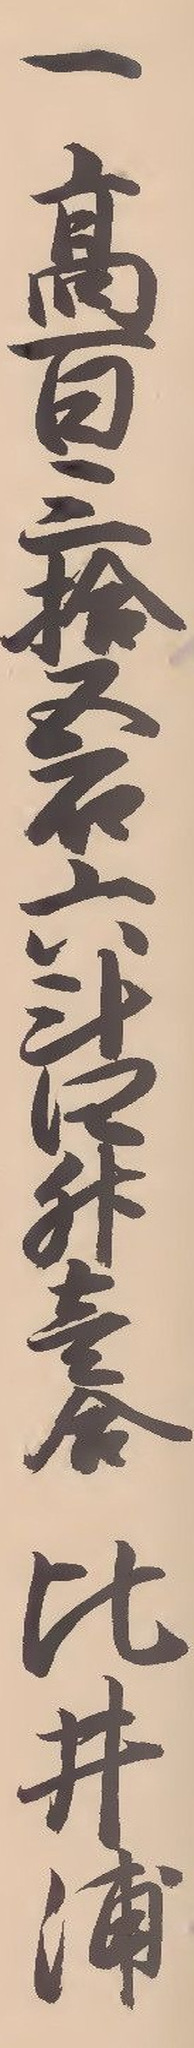一高百三拾五石六斗四升壱合比井浦
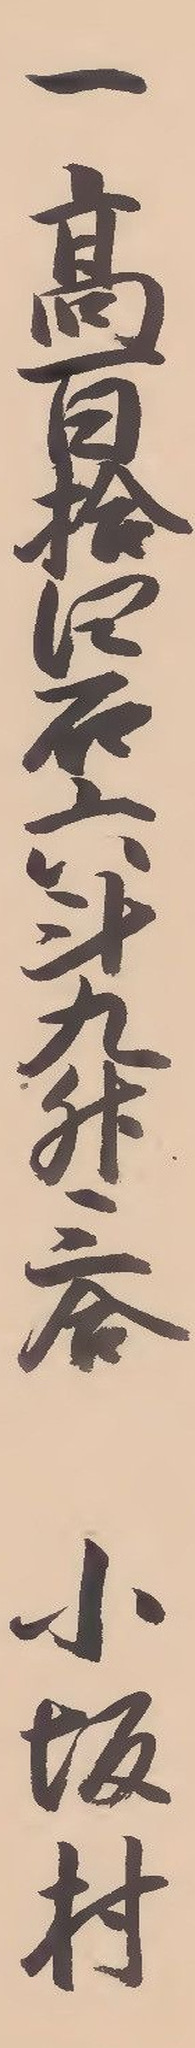一高百拾四石六斗九升三合小坂村
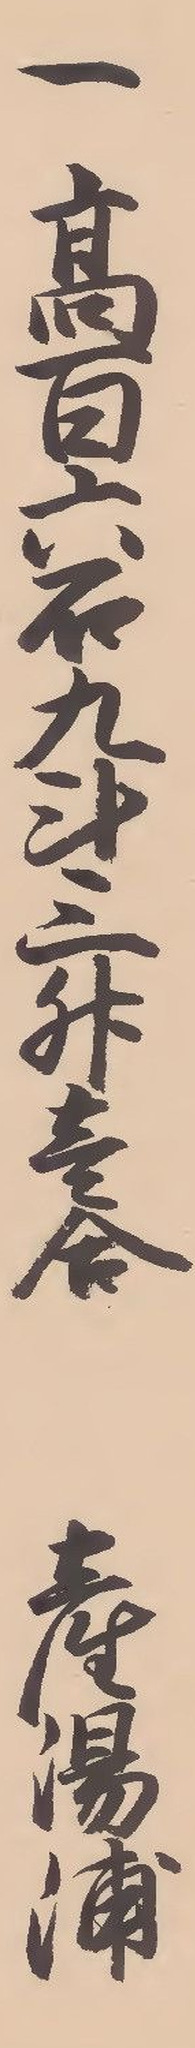一高百六石九斗三升壱合産湯浦
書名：紀伊国郷帳
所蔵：国立公文書館 National Archives of Japan
